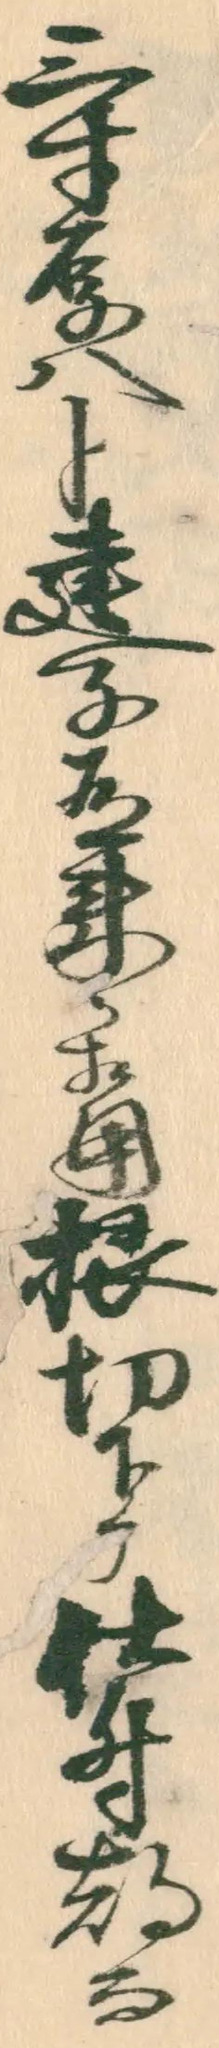三寸厚八分建子有来り相用根切下ケ仕付都而
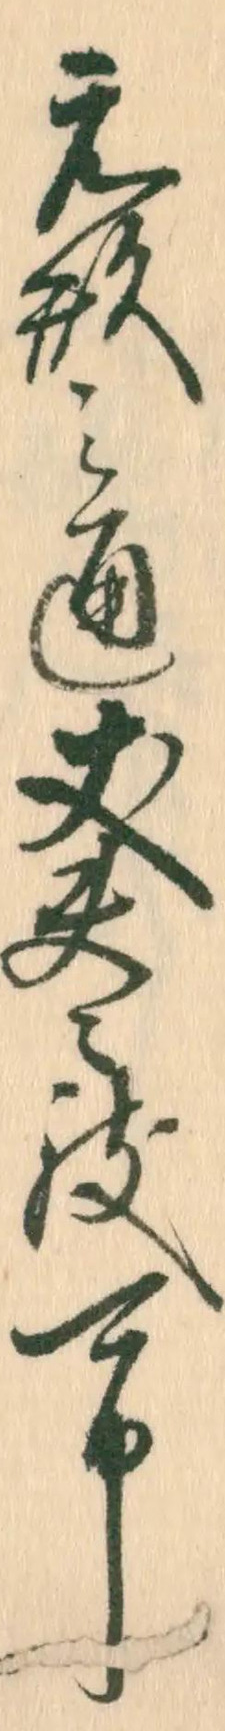元形之通丈夫ニ致可申
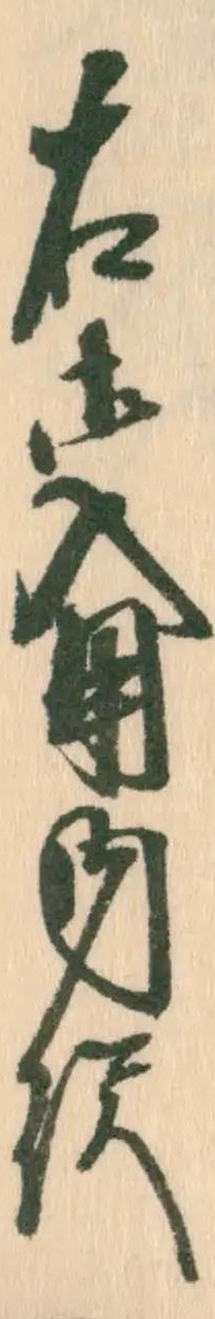右御入用内訳
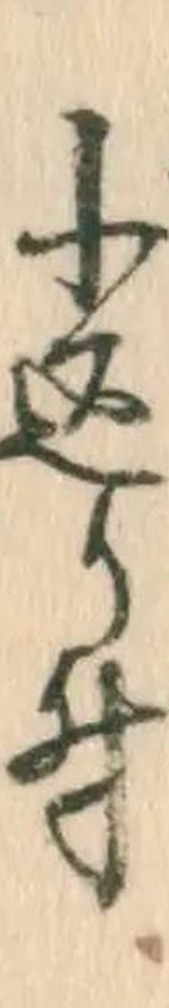小返り付
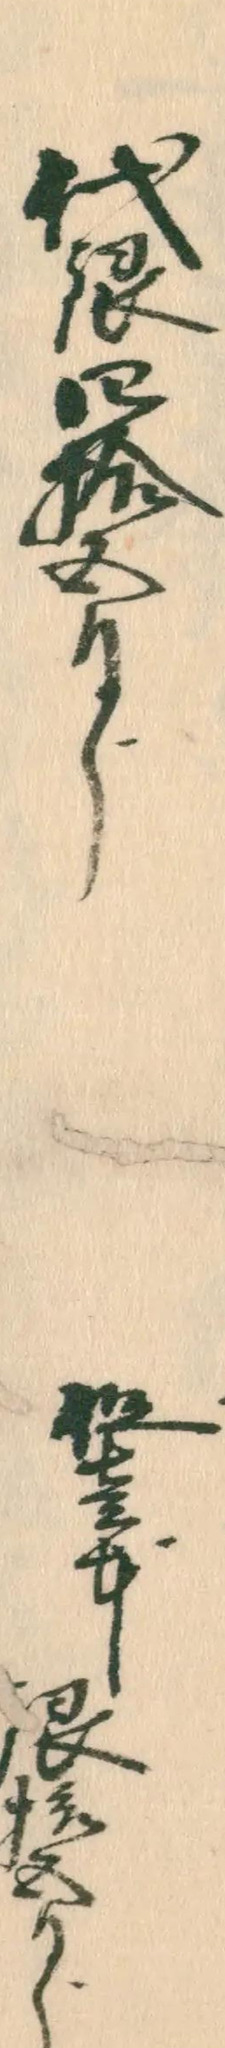代銀四拾五匁但壱本銀拾五匁
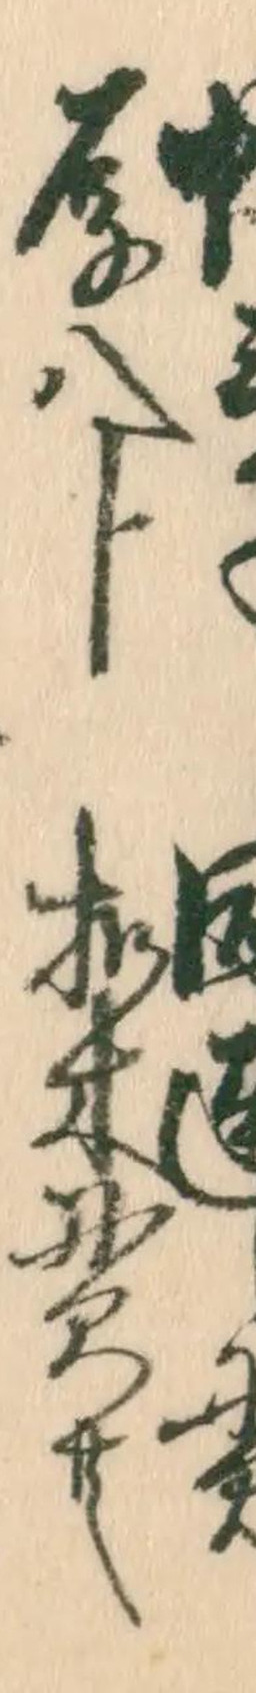厚八分扣木貫共
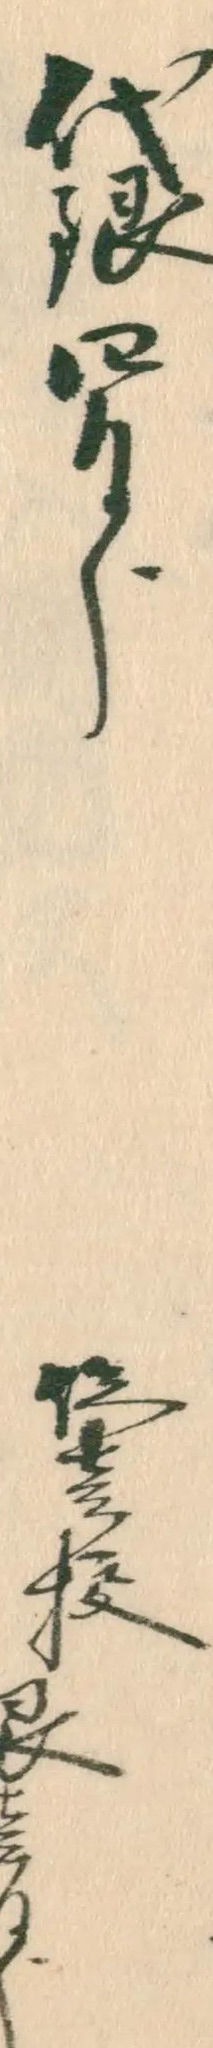代銀四匁但壱挺銀壱匁
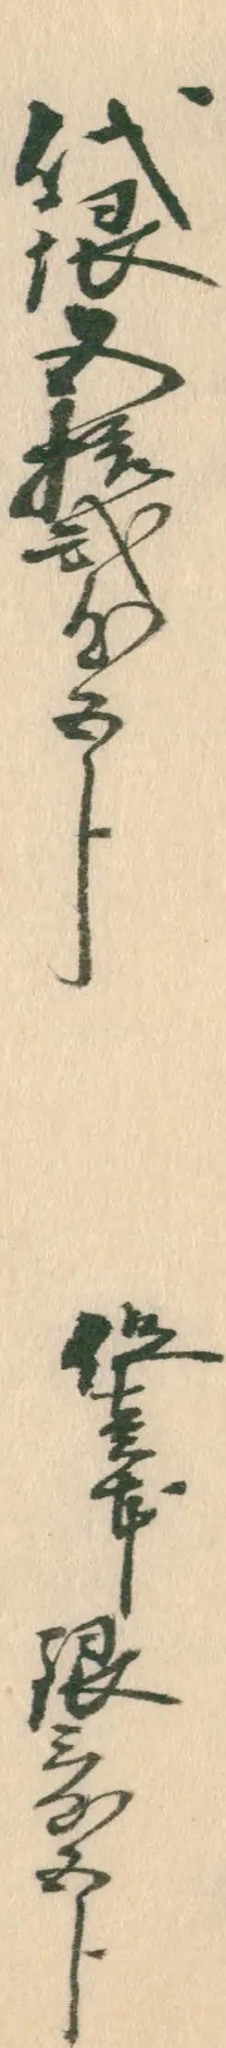代銀五拾弐匁五分但壱本銀三匁五分
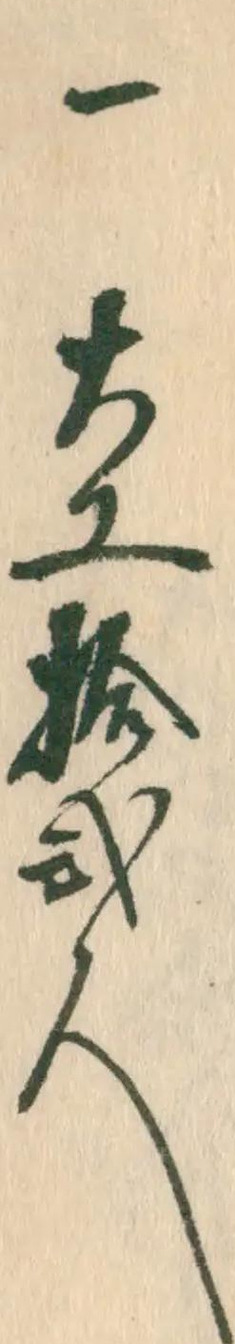一大工拾弐人

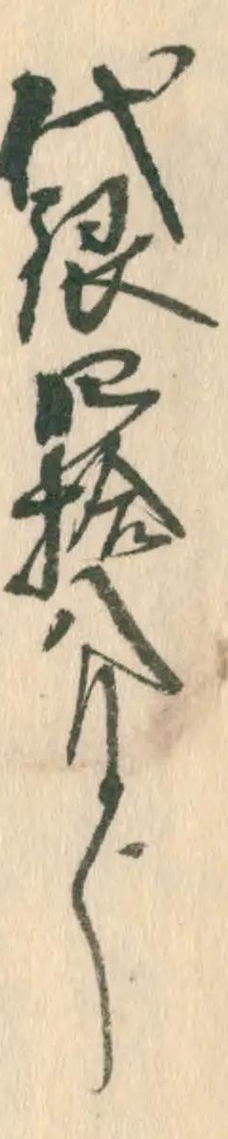代銀四拾八匁但壱人銀四匁
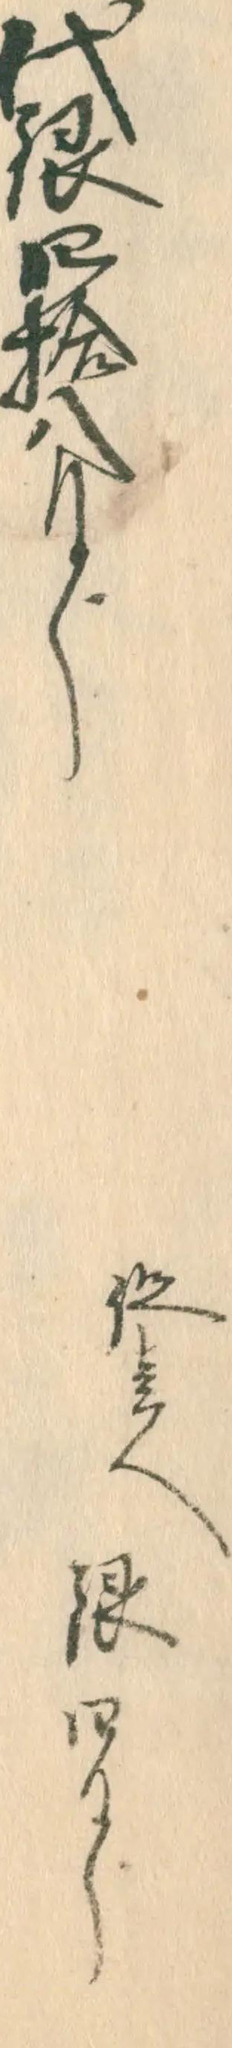代銀四拾八匁但壱人銀四匁
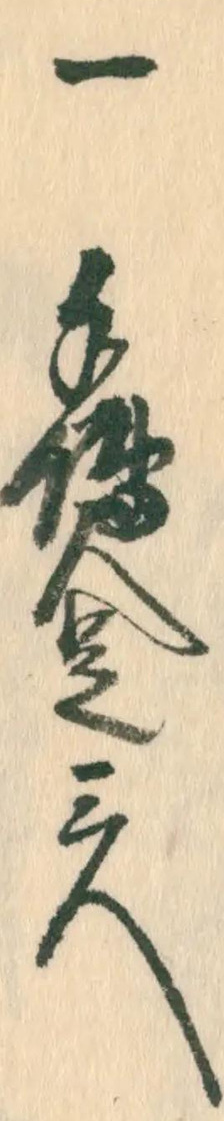一手伝人足三人
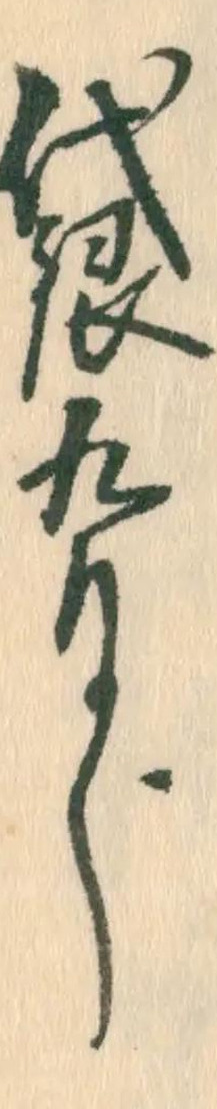代銀九匁但壱人銀三匁
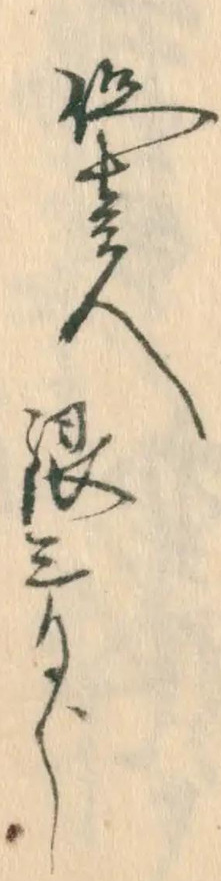代銀九匁但壱人銀三匁
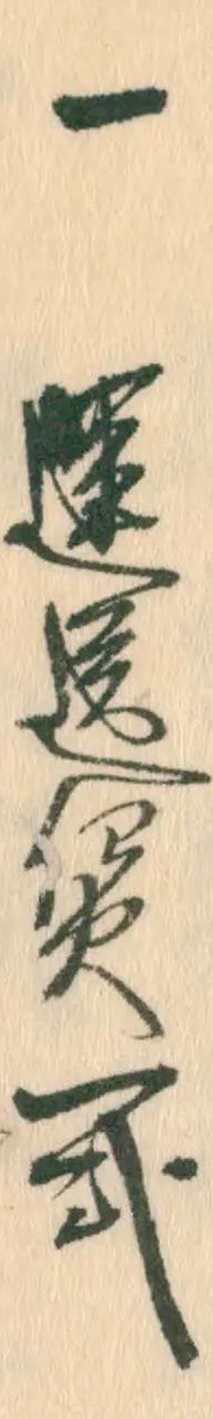一運送賃一式
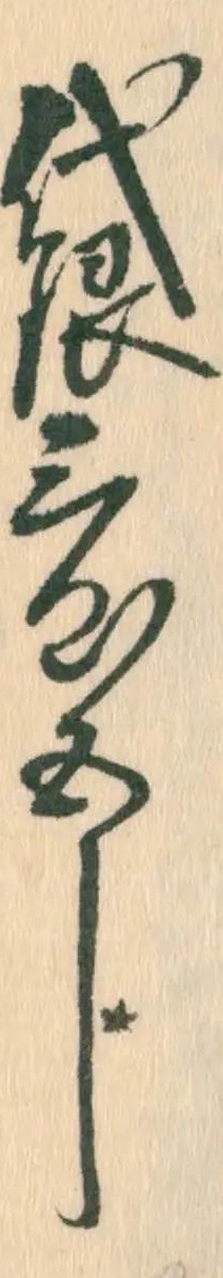代銀三匁五分
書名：三橋 17巻. [8] 三橋小破御修復書留　但御奉行御掛リ替地震潰橋番屋　嘉永四亥年より安政二卯年迄　下
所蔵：国立国会図書館 National Diet Library, JAPAN
